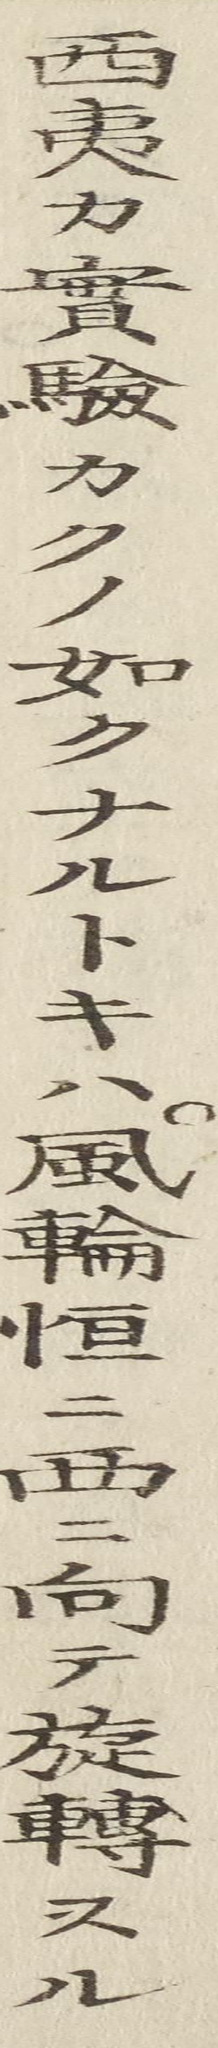西夷カ実験カクノ如クナルトキハ。風輪恒ニ西ニ向テ旋転スル
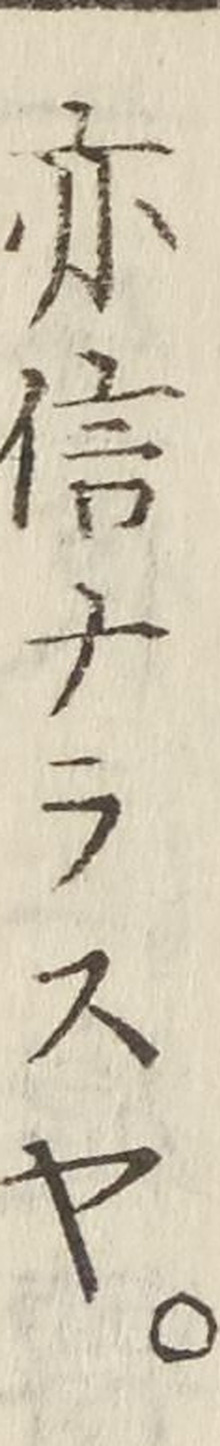亦信ナラスヤ。
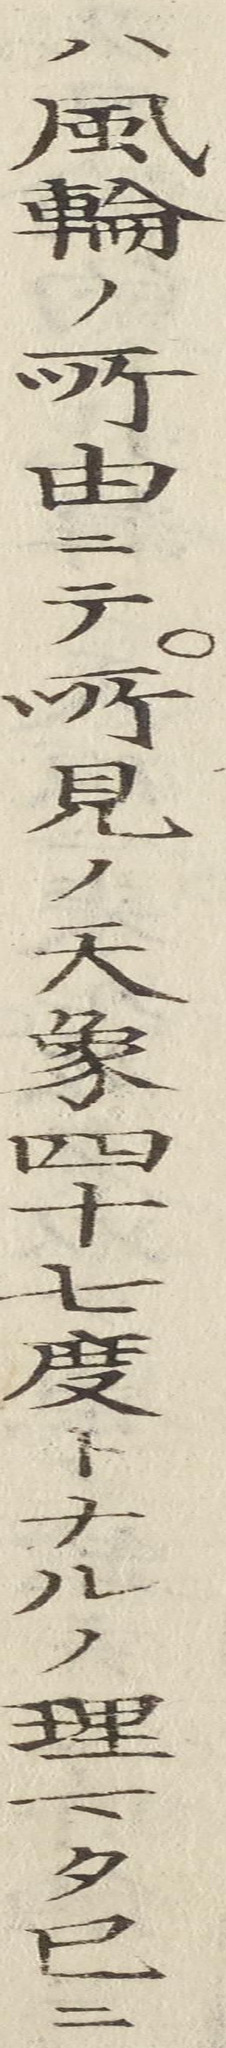ハ風輪ノ所由ニテ。所見ノ天象四十七度トナルノ理マタ已ニ
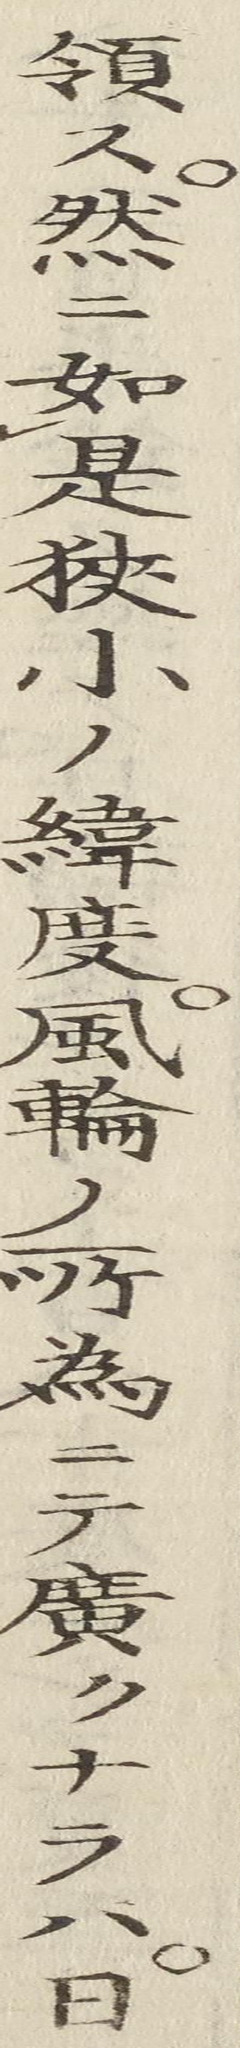領ス。然ニ如是狭小ノ緯度。風輪ノ所為ニテ広クナラハ。日
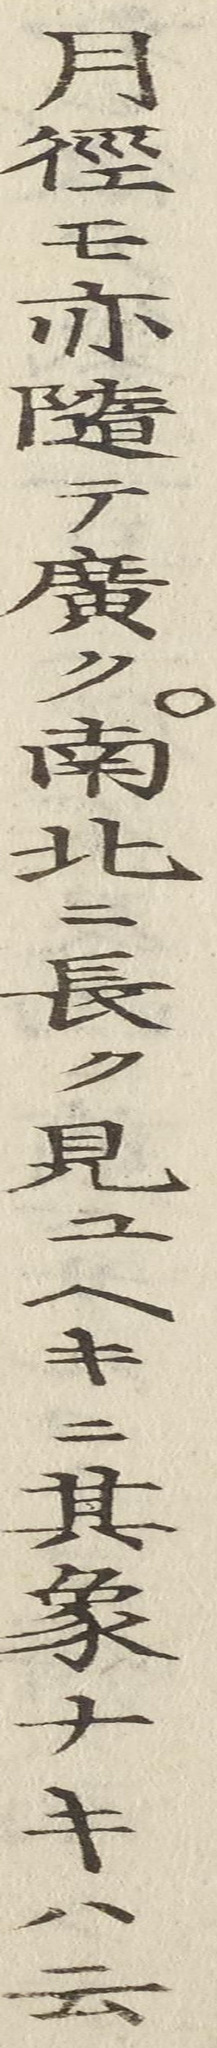月経モ亦随テ広ク。南北ニ長ク見ユヘキニ其象ナキハ云
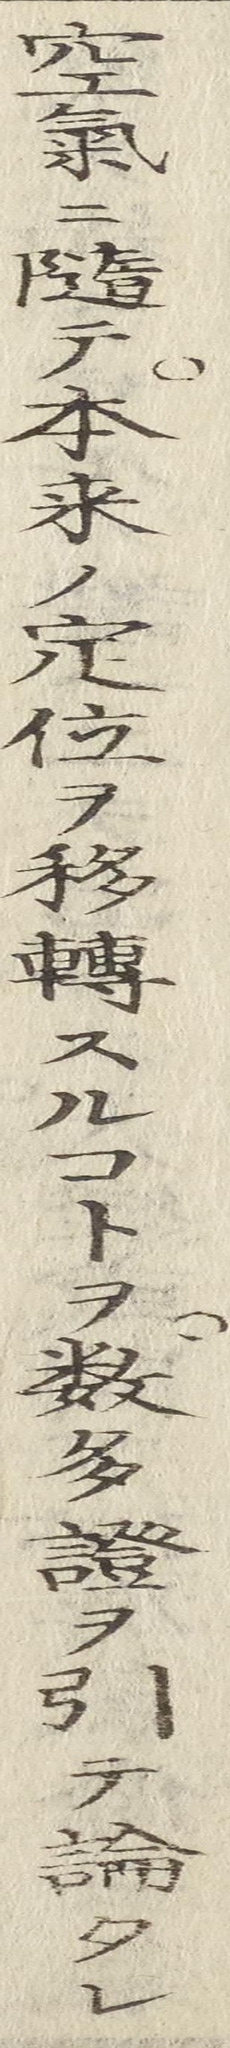空気ニ随テ。本来ノ定位ヲ移転スルコトヲ。数多証ヲ引テ論タレ
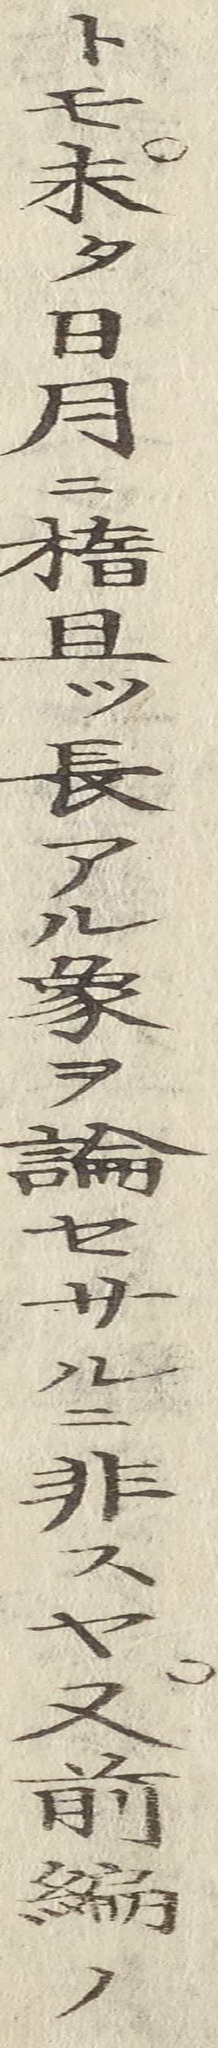トモ。未タ日月ニ楕且ツ長アル象ヲ論セサルニ非スヤ。又前編ノ
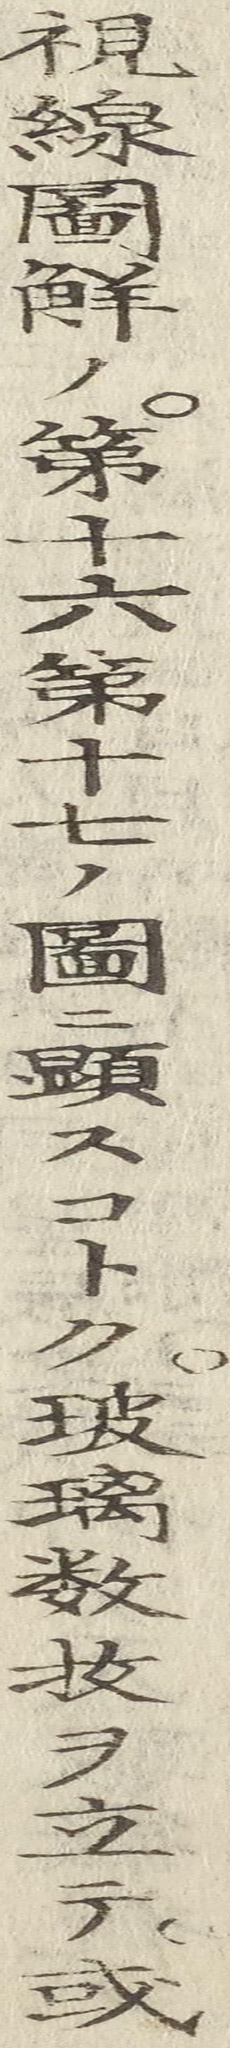視線図鮮ノ。第十六第十七ノ図ニ顕スコトク。玻璃数枚ヲ立テ。或
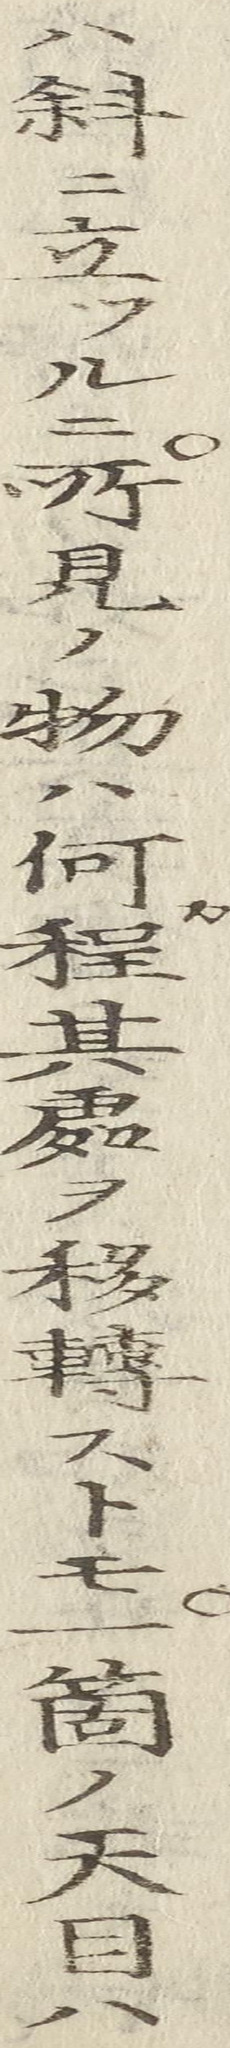ハ斜ニ立ツルニ。所見ノ物ハ何程其処ヲ移転ストモ。一箇ノ天目ハ
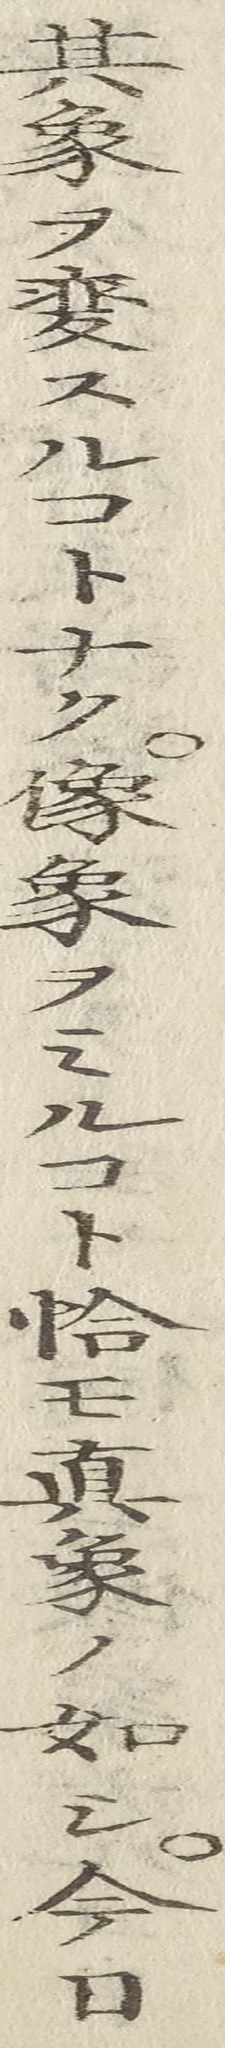其象ヲ変スルコトナク。像象ヲミルコト恰モ真象ノ如シ。今日
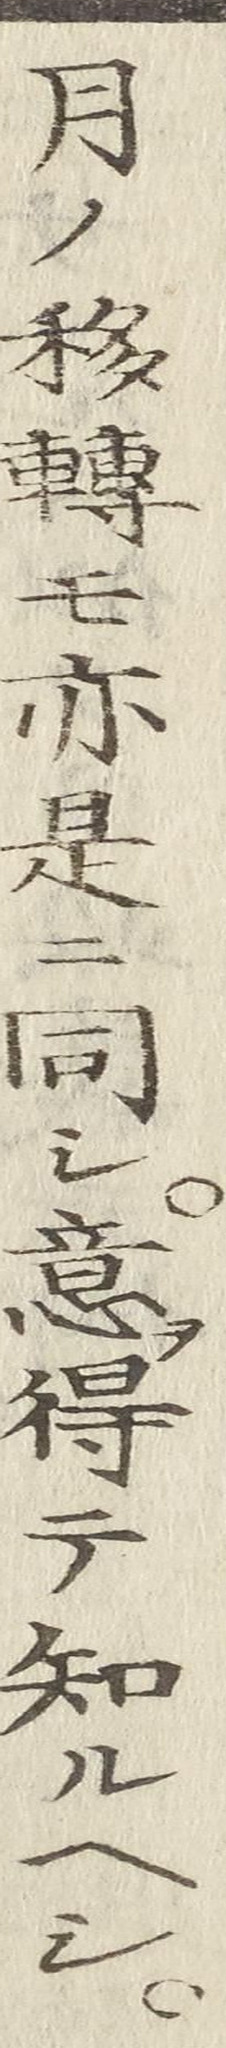月ノ移転モ亦是ニ同シ。意得テ知ルヘシ。
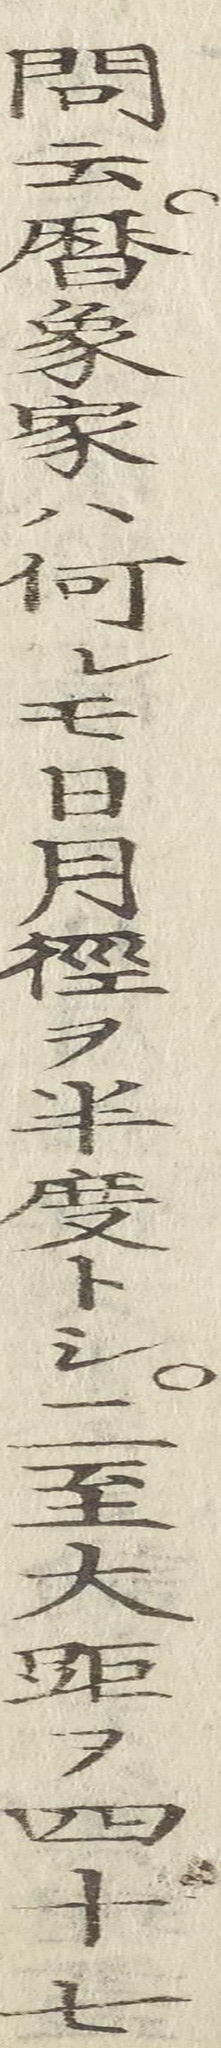問云。暦象家ハ何レモ日月経ヲ半度トシ。ニ至大距ヲ四十七
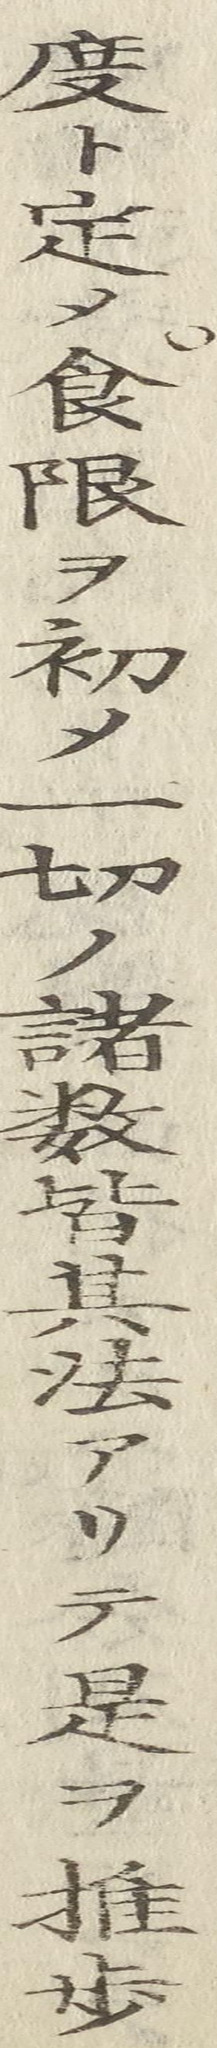度ト定メ。食限ヲ初メ一切ノ諸数皆其法アリテ是ヲ推歩
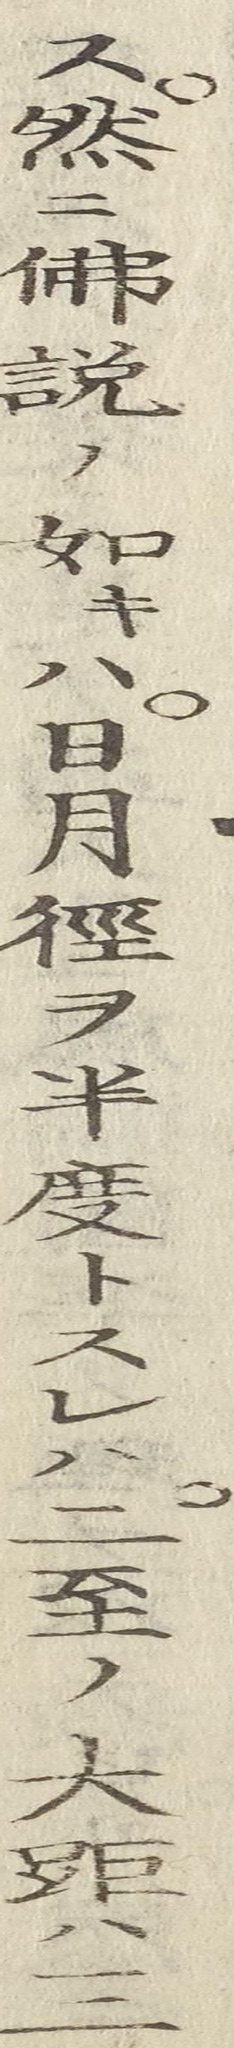ス。然ニ仏説ノ如キハ。日月経ヲ半度トスレハ。ニ至ノ大距ハ三

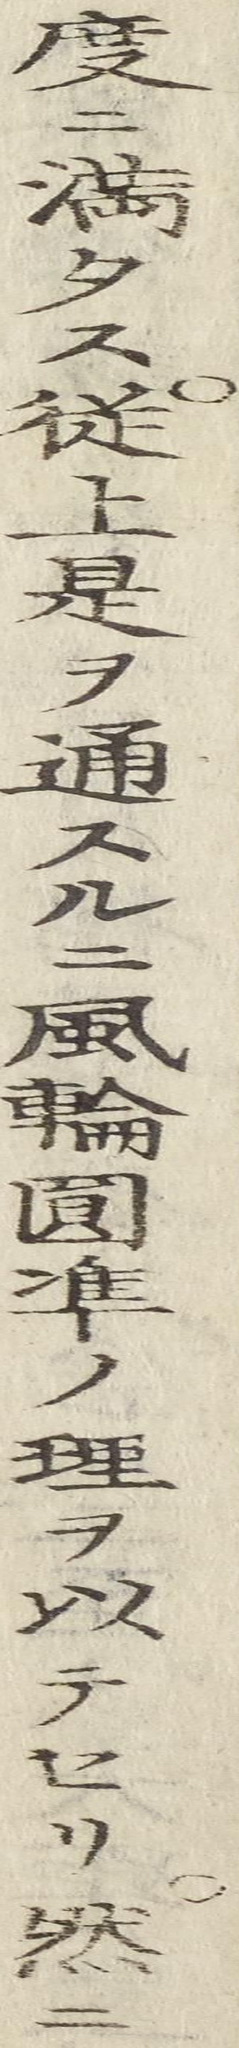度ニ満タス。従上是ヲ通スルニ風輪円準ノ理ヲ以テセリ。然ニ
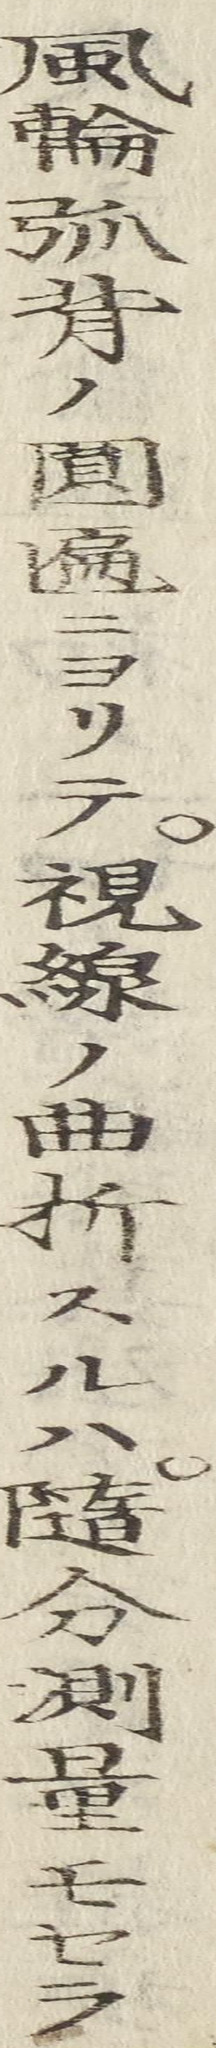風輪弧背ノ円遍ニヨリテ。視線ノ曲折スルハ。随分測量モセラ
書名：護法新論　二編　上
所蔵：東京大学地震研究所図書室 Earthquake Research Institute Library, The University of Tokyo, JAPAN
